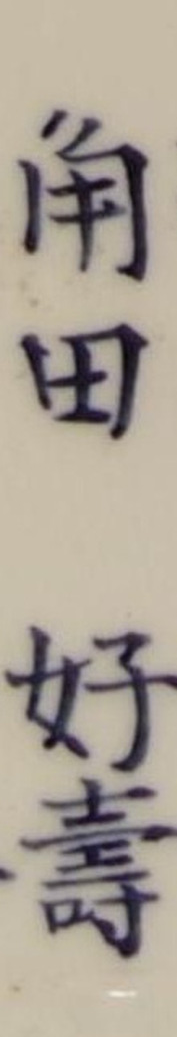角田好寿
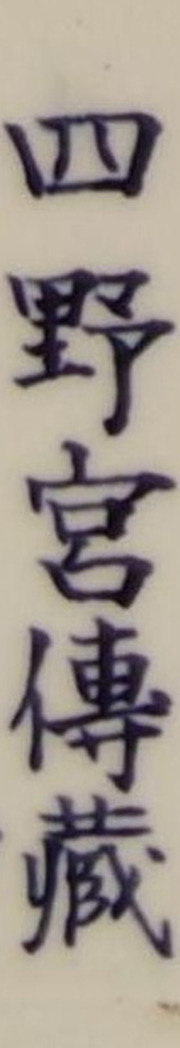四野宮伝蔵
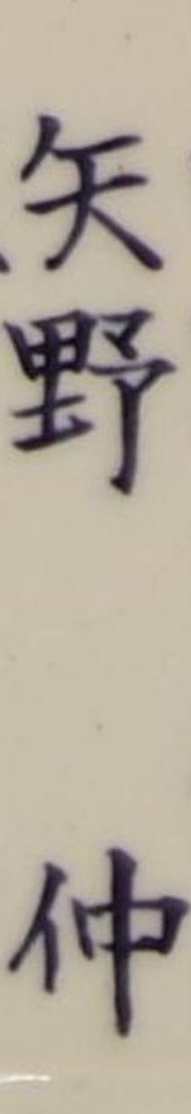矢野仲
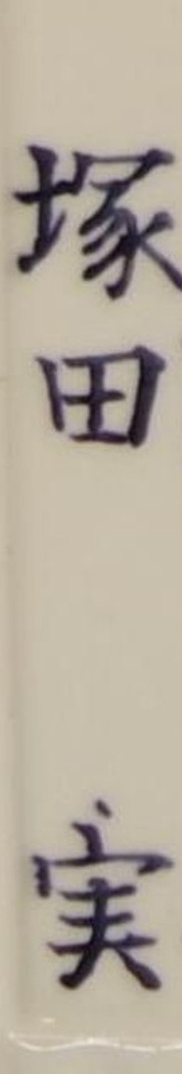塚田実

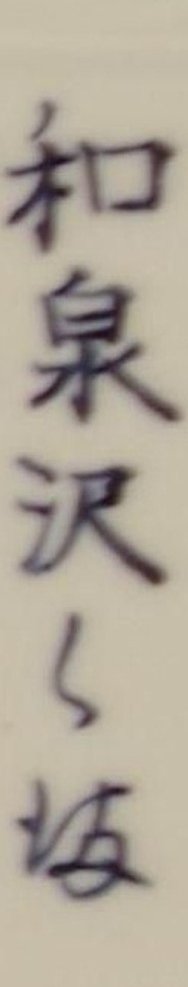和泉沢くま
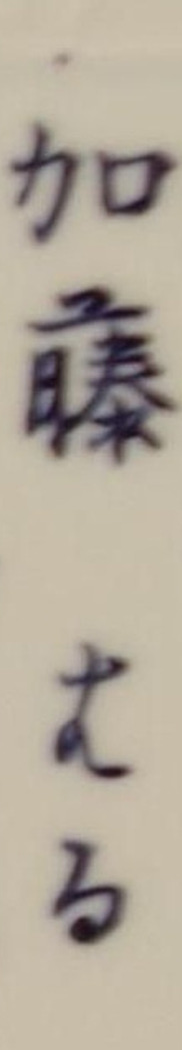加藤はる
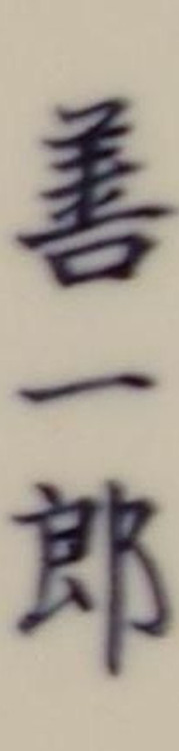善一郎
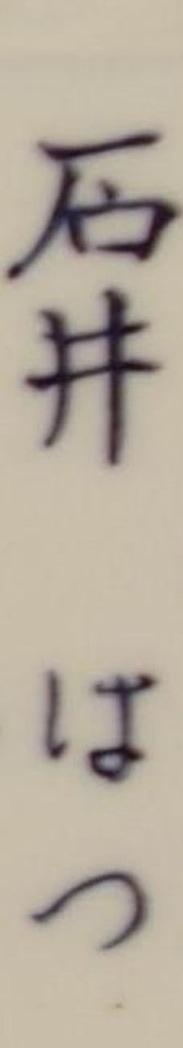石井はつ
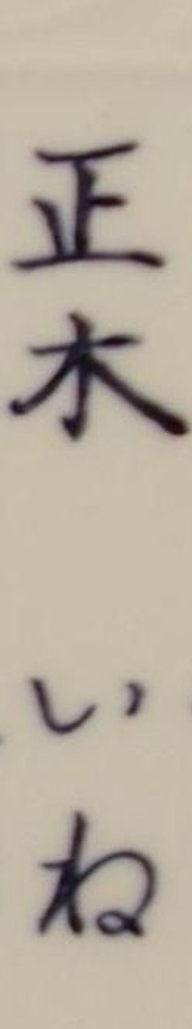正木いね
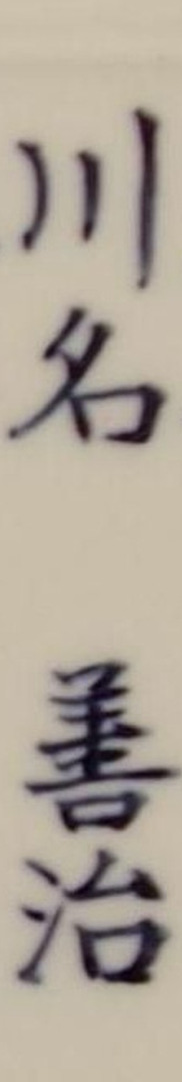川名善治
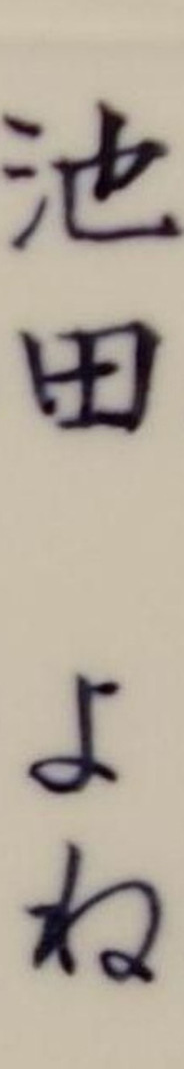池田よね
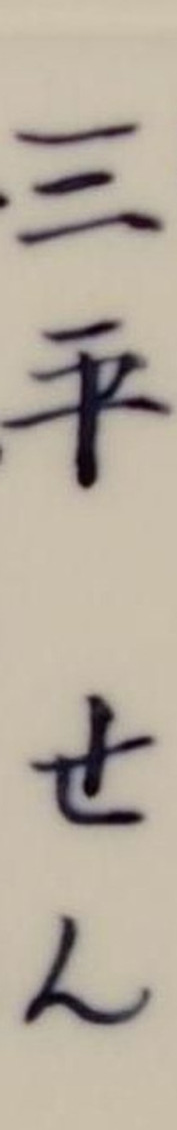三平せん
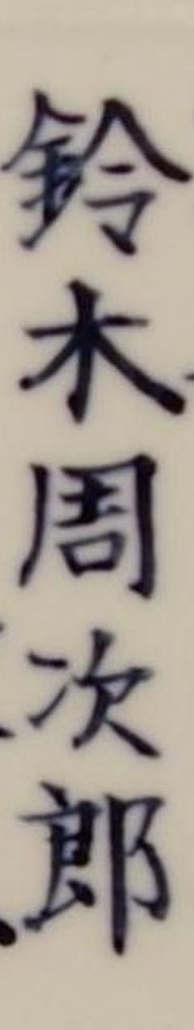鈴木周次郎
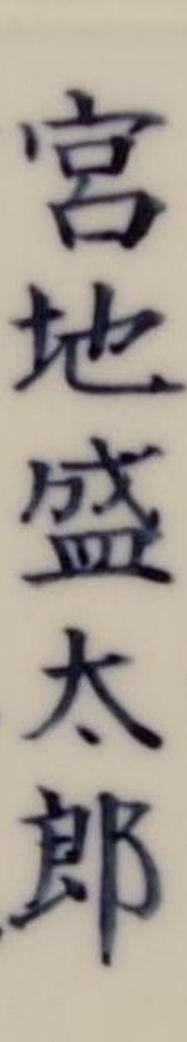宮地盛太郎
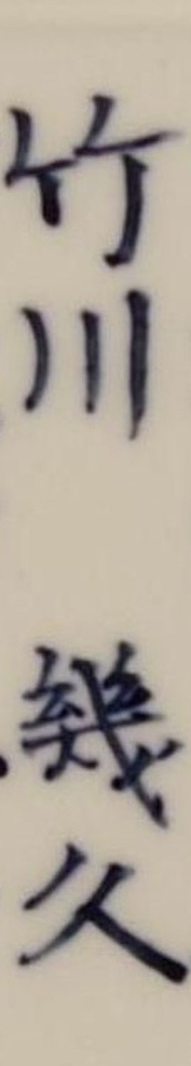竹川幾久
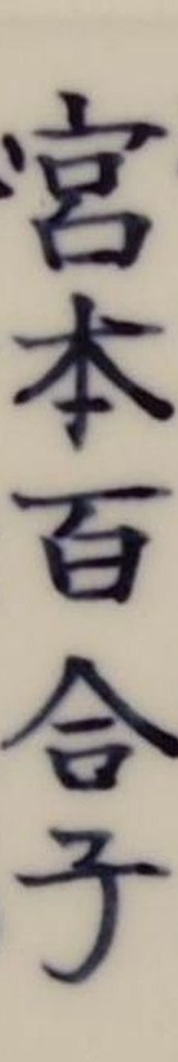宮本百合子
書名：M~S
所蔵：高野山金剛峯寺
